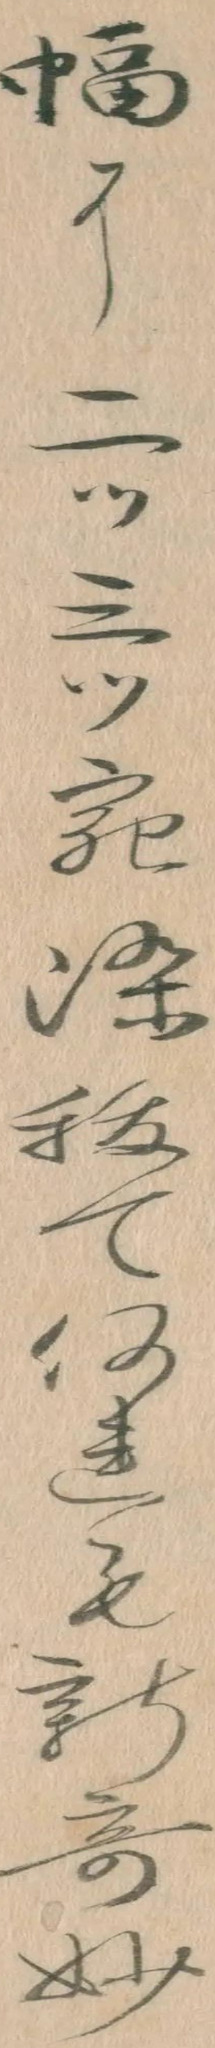幅に二つ三つ宛染抜て何れも新竒妙
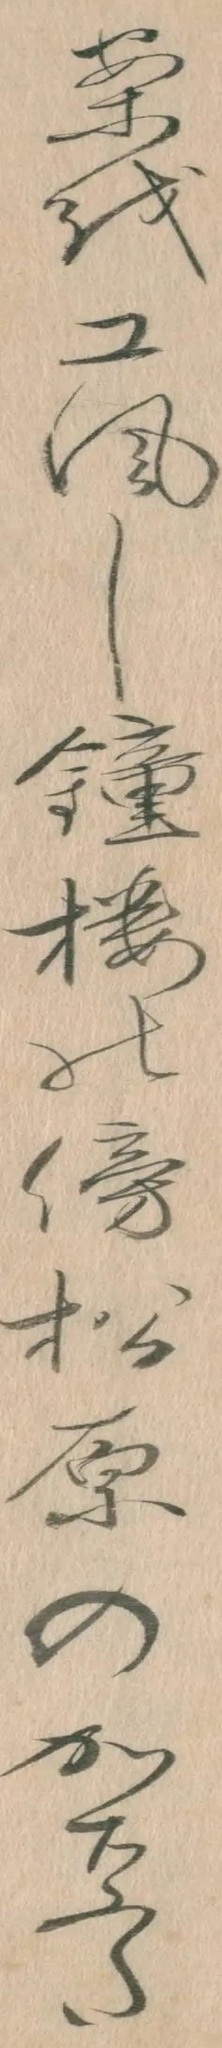案を工風し鐘楼の傍松原のかなた
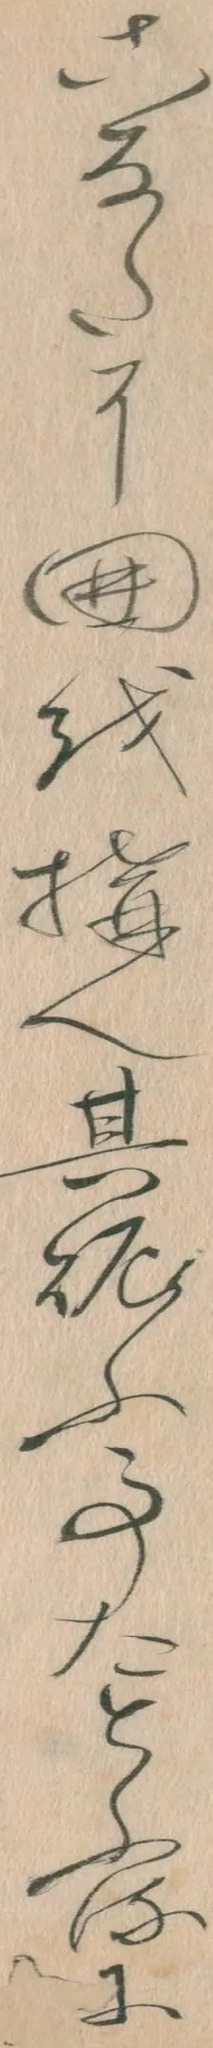こなたに囲を構へ其振ふ事たとふるに
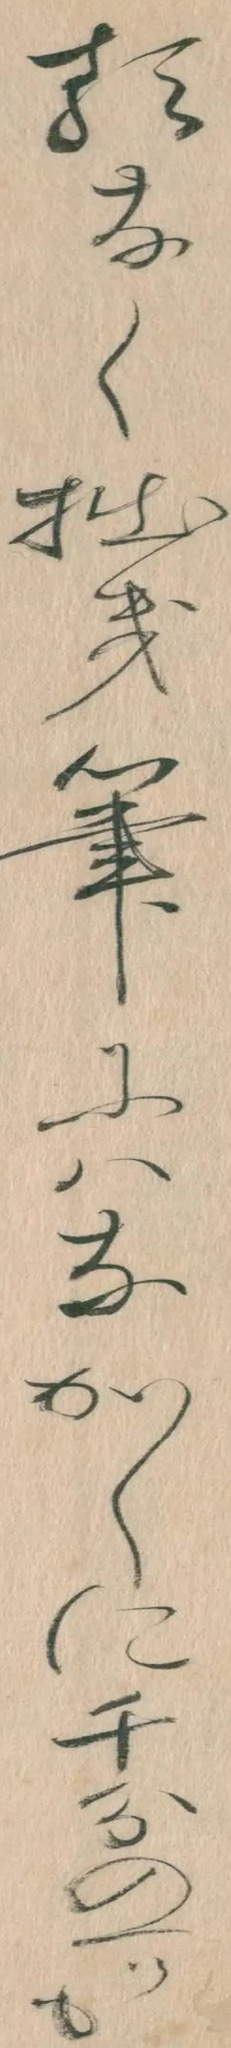類なく拙き筆にはなか〳〵に千分の一にも
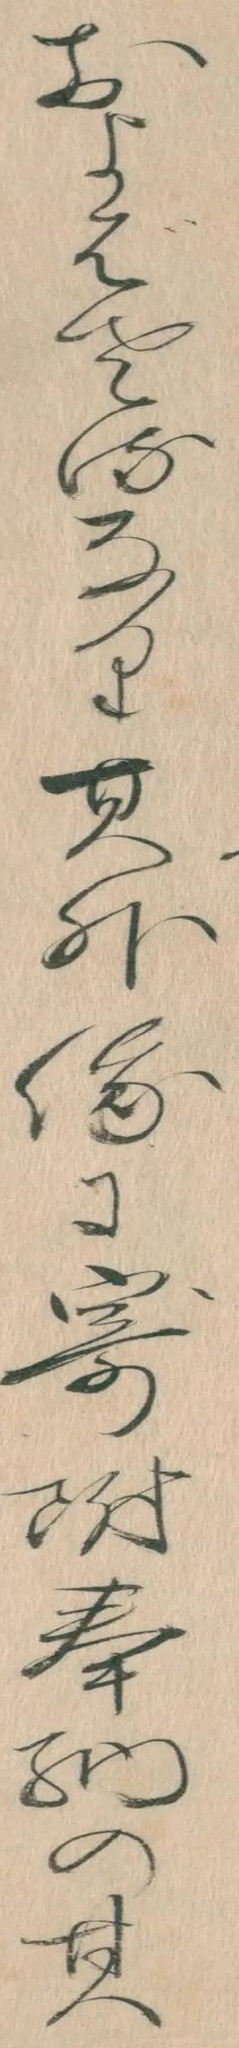およばさるなり其外俄に寄附奉納の其
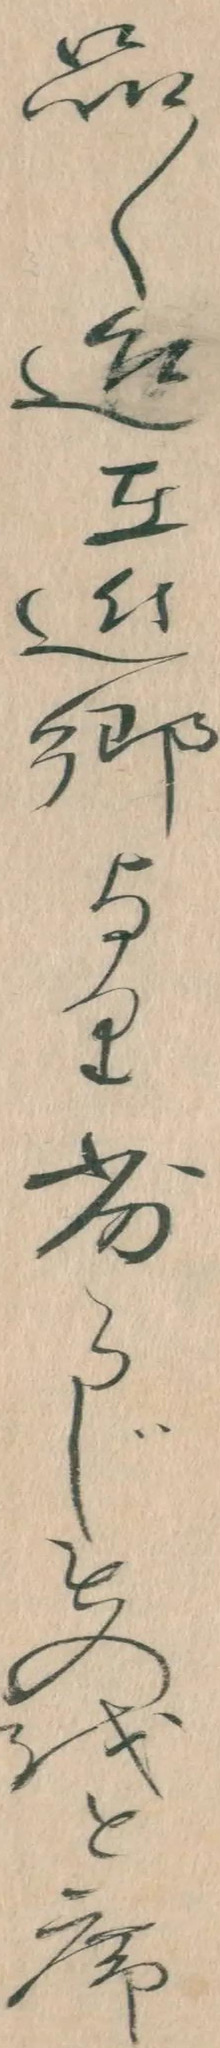品〳〵近在近郷より劣らじものをと席
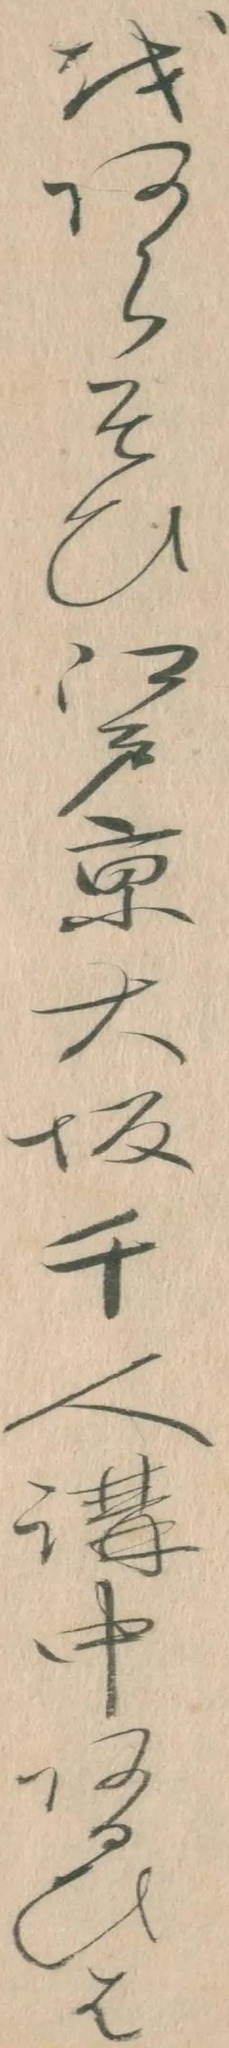をあらそひ江戸京大坂千人講中あるひは
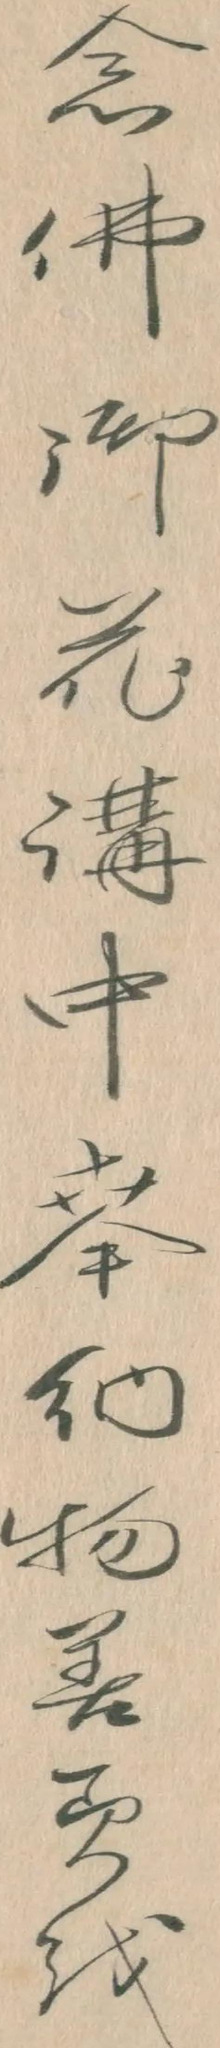念佛御花講中奉納物善美を
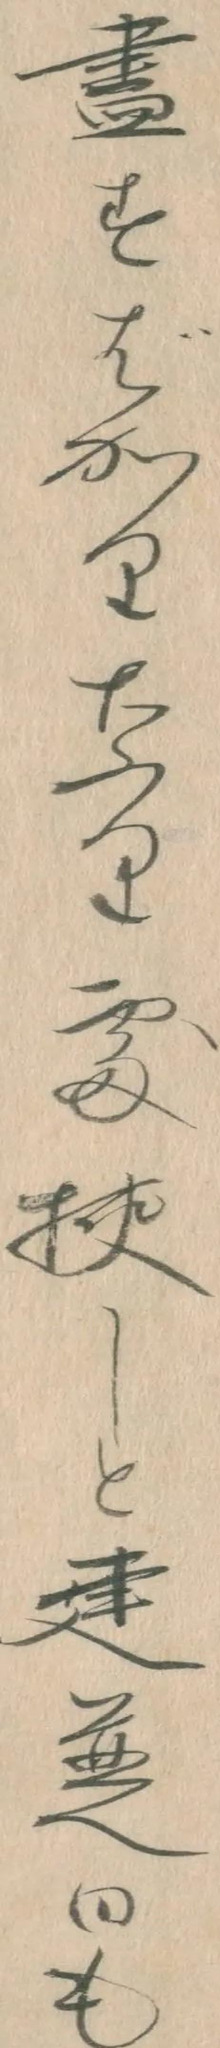盡すばかりなり處狭しと建並へ日も

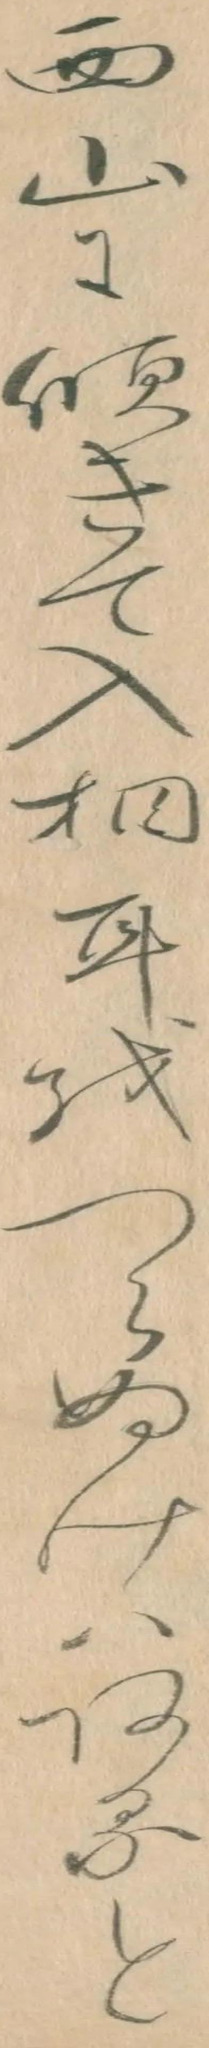西山に傾きて入相耳をつらぬけはあると
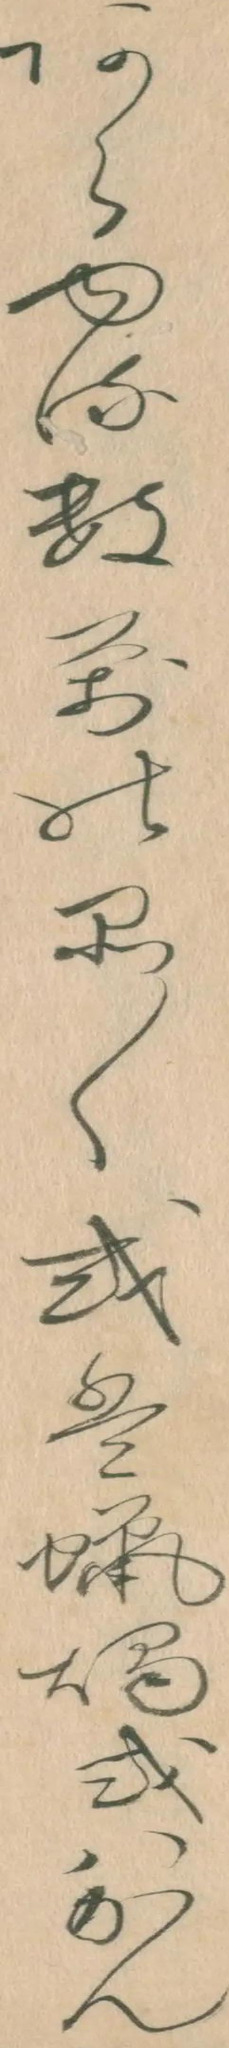あらゆる数萬の品〳〵或は蝋燭或はかん
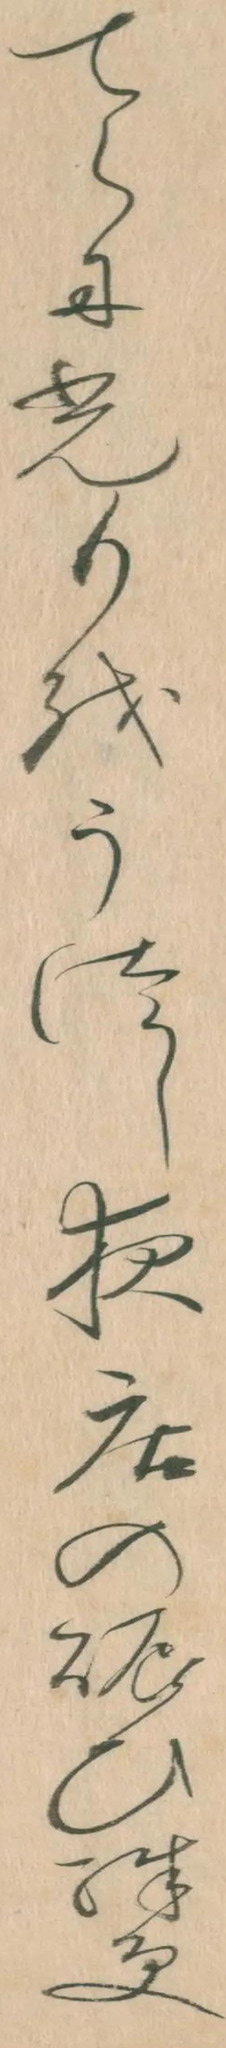てらに光りをうつし夜店の賑わい殊更
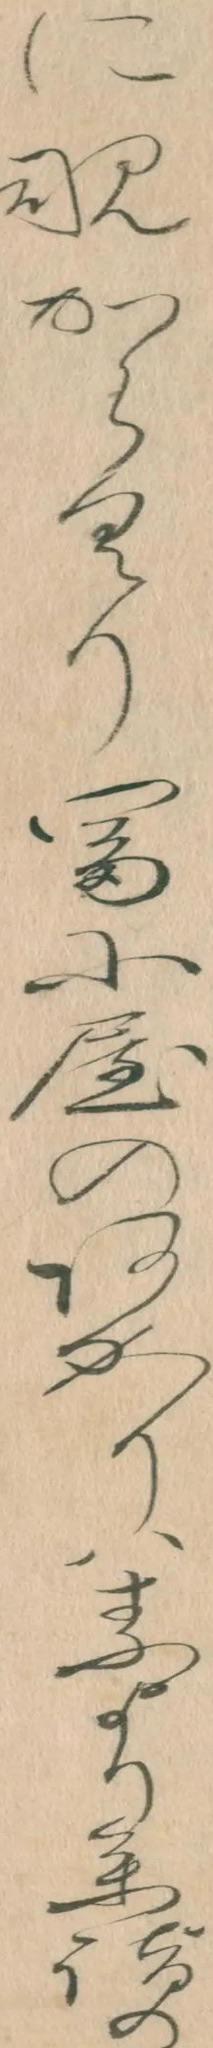に覗からくり冨小屋のあかりは素より参詣の
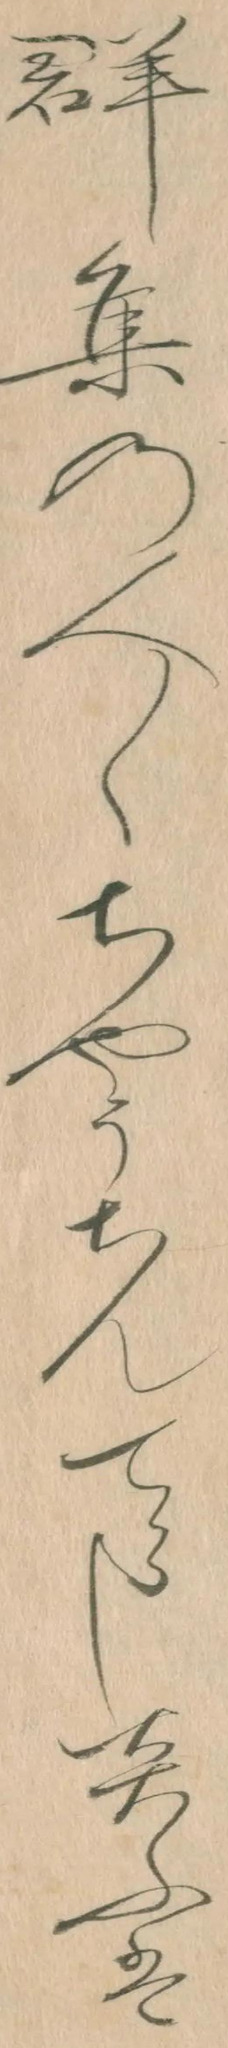群集の人〳〵ちやうちんてらし炎ふは
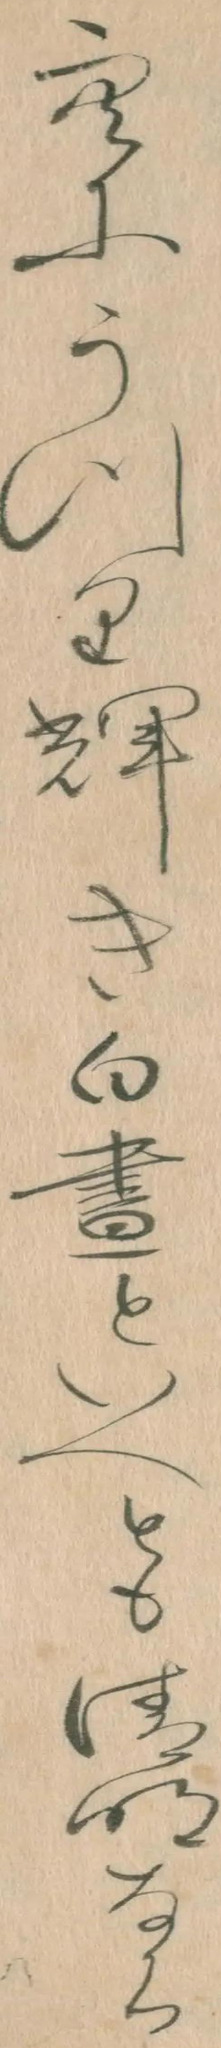空にうつり輝き白畫といへとも清明なら
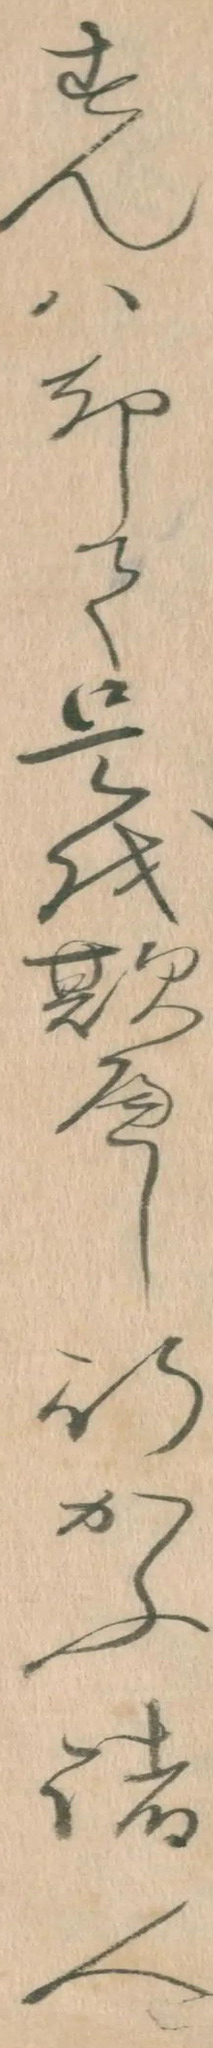すんは却て是を欺へし行かふ諸人
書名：俗語之種. [2]
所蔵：国立国会図書館 National Diet Library, JAPAN
